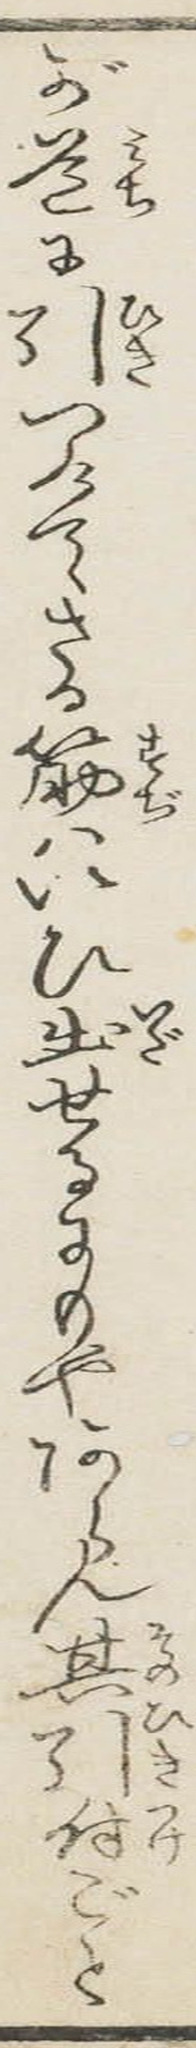が道に引つけてさる筋はいひ出せるにもやあらん其引付ごと
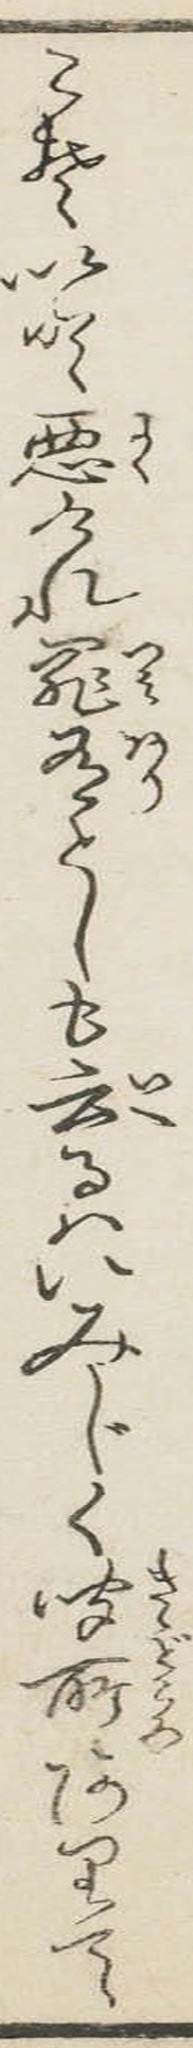こそいと悪けれ罪有としも云るはいみじく聞所ありて
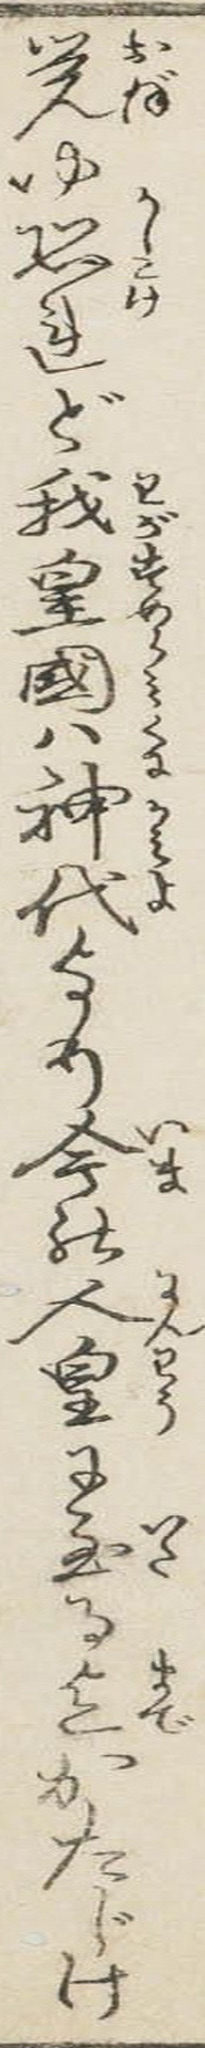覚ゆ恐れど我皇国は神代より今の人皇に至る迄かたじけ
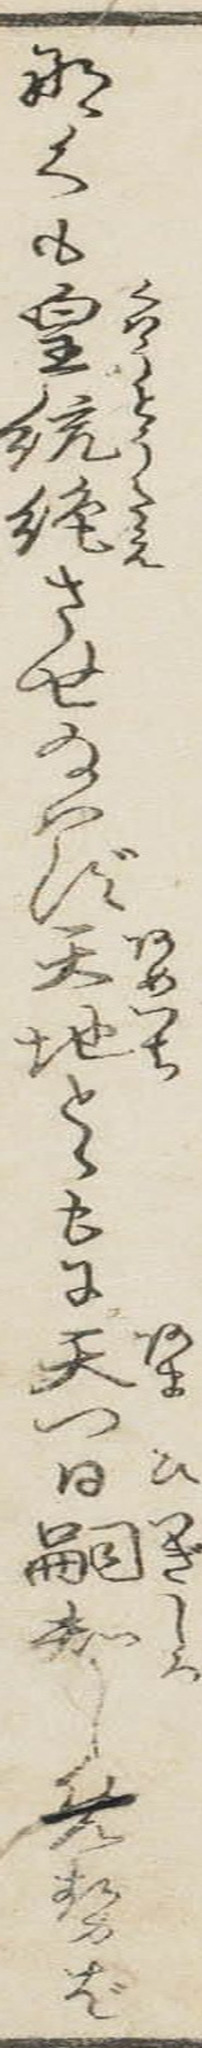まくも皇統絶させ給はず天地とゝもに天つ日嗣知しめせば
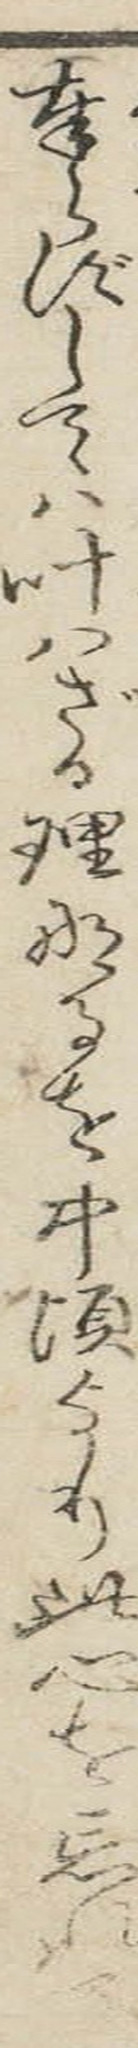奉らずしては叶はざる理なるを中頃より此心を忘れて道々
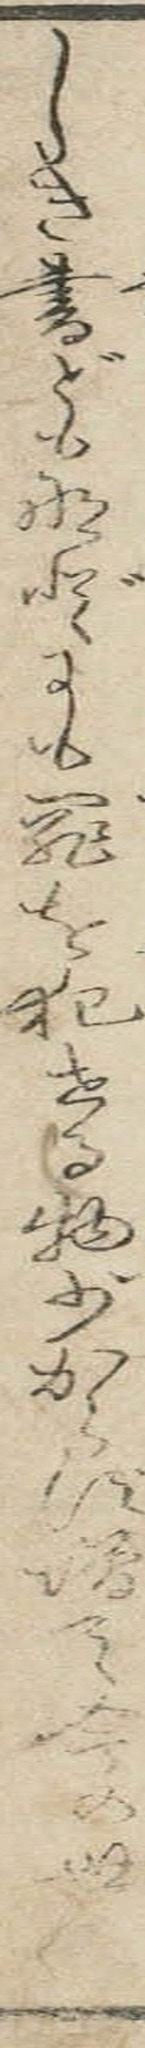しき書どもなどにも罪を犯せる物少からず増て今の世の

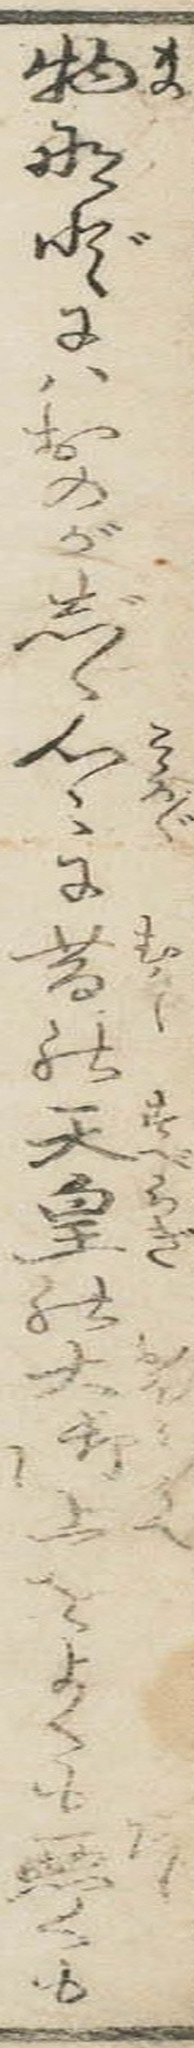物などにはおのがじし心々に昔の天皇の大御上をよくも悪くも
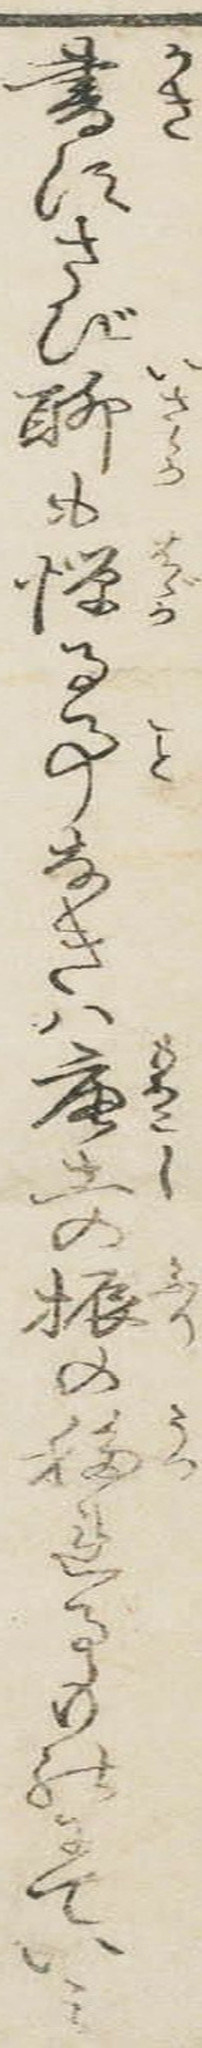書すざび聊も憚る事なきは唐土の振の移れるものにていみ
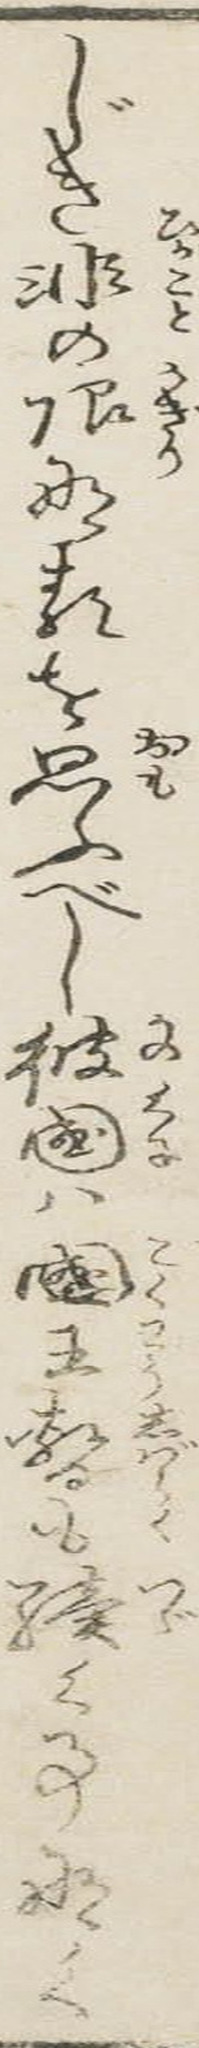じき非の限なるを思ふべし彼国は国王暫も続く事なく
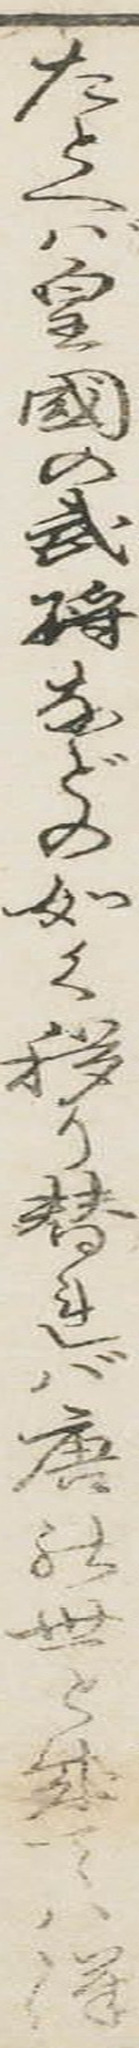たとへば皇国の武将などの如く移り替れば唐の世と成ては漢
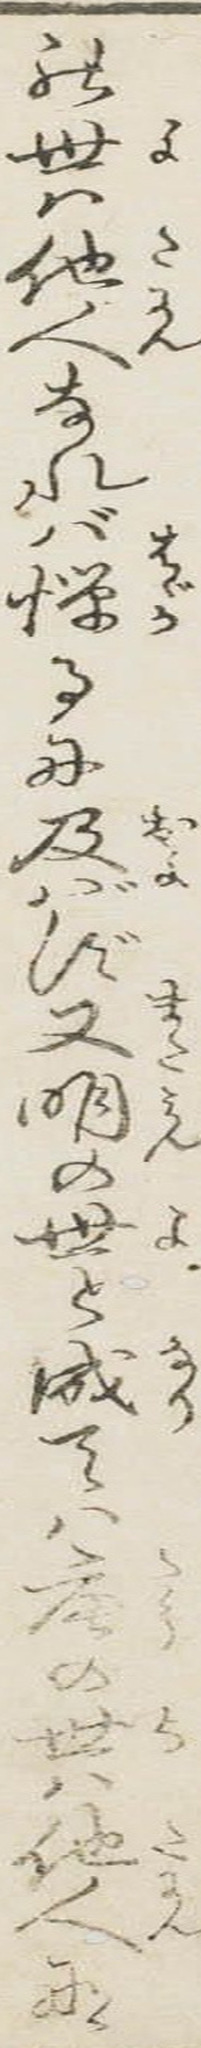の世は他人なれば憚るに及ばず又明の世と成ては唐の世は他人な
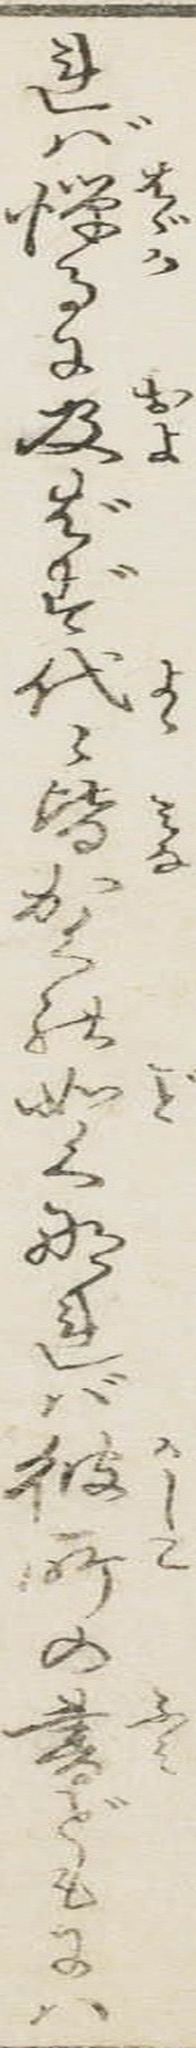れば憚るに及ばず代々皆かくの如くなれば彼所の書どもには
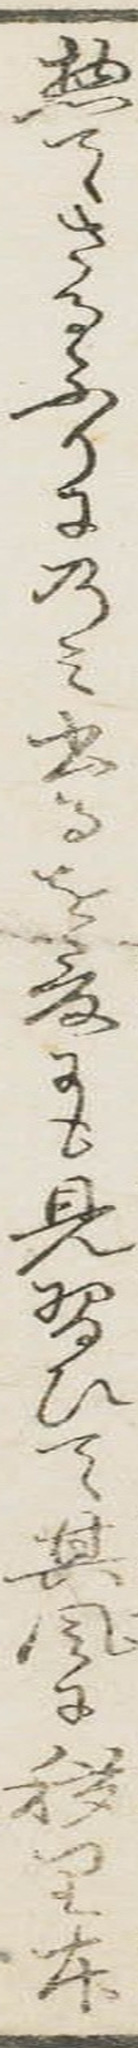総てさるふりにのみ書るを爰にも見習ひて其風に移り本
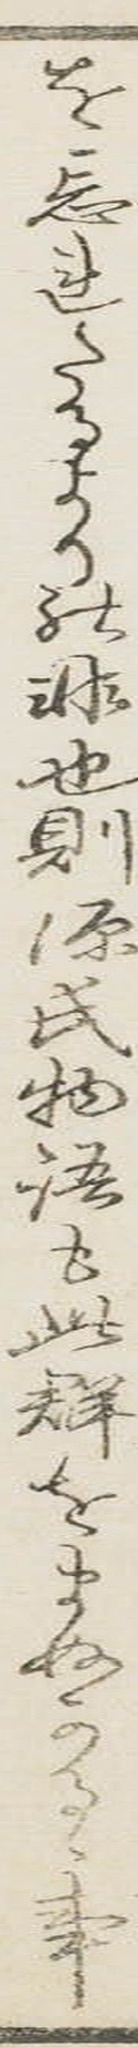を忘れたるよりの非也則源氏物語も此群をまぬかるゝ事
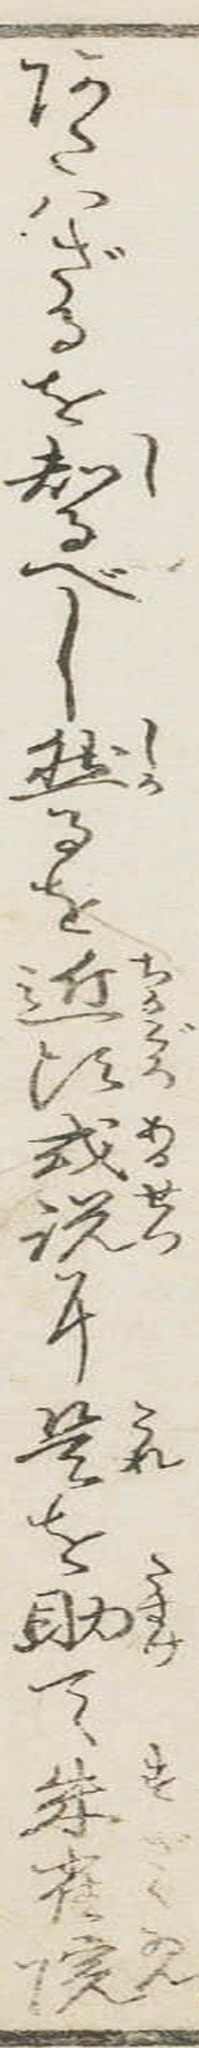あたはざるを知るべし然るを近頃或説に是を助て朱雀院
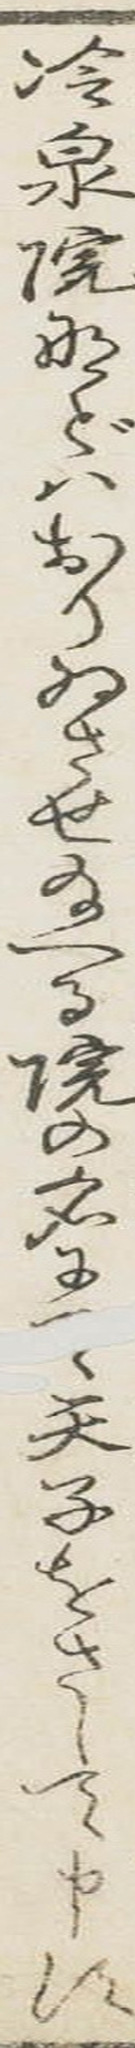冷泉院などはおりゐさせ給へる院の名にて天子をさして申す
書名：源氏百人一首
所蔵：東京学芸大学教育コンテンツアーカイブ
